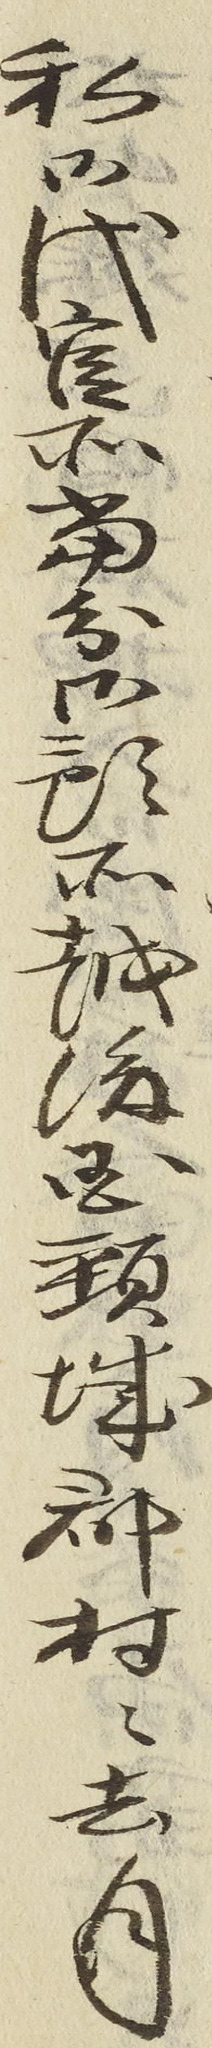私御代官所当分御預所越後之国頸城郡村々去月
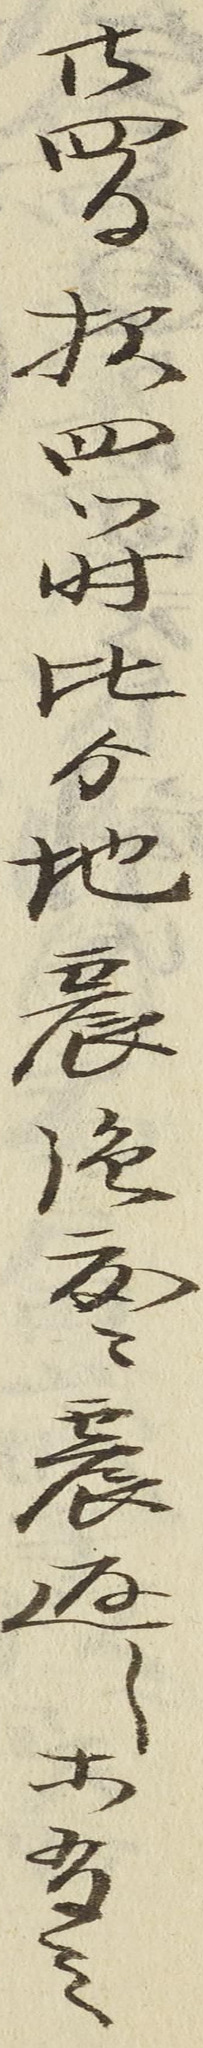廿四日夜四ッ時比ゟ地震強度々震返し等有之
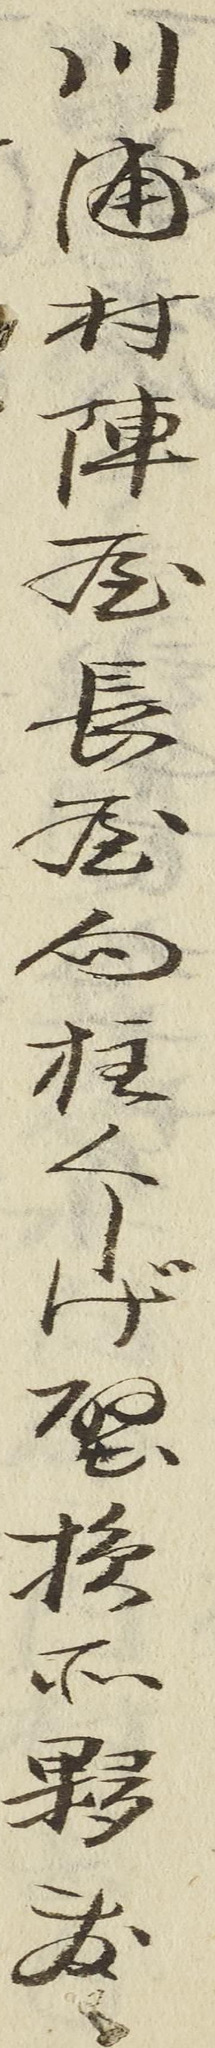川浦村陣屋本陣長屋向柱くしげ壁損所夥敷
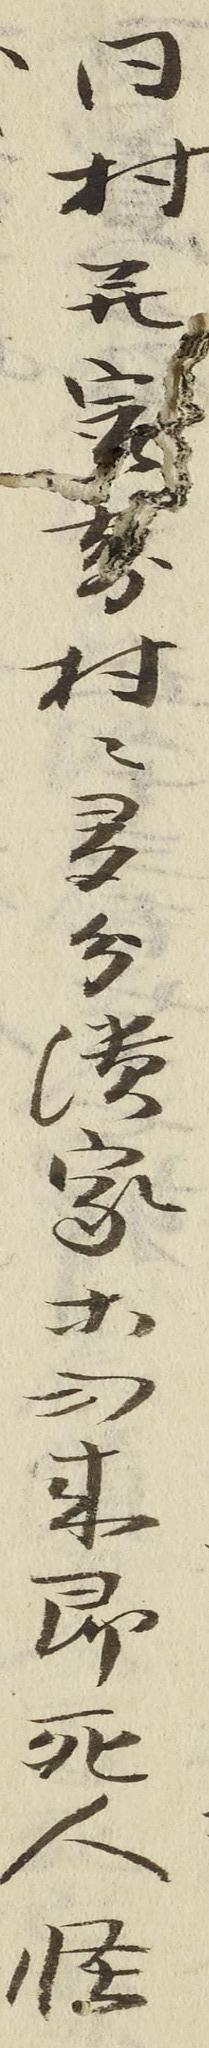同村并最寄村々多分潰家等出来即死人怪
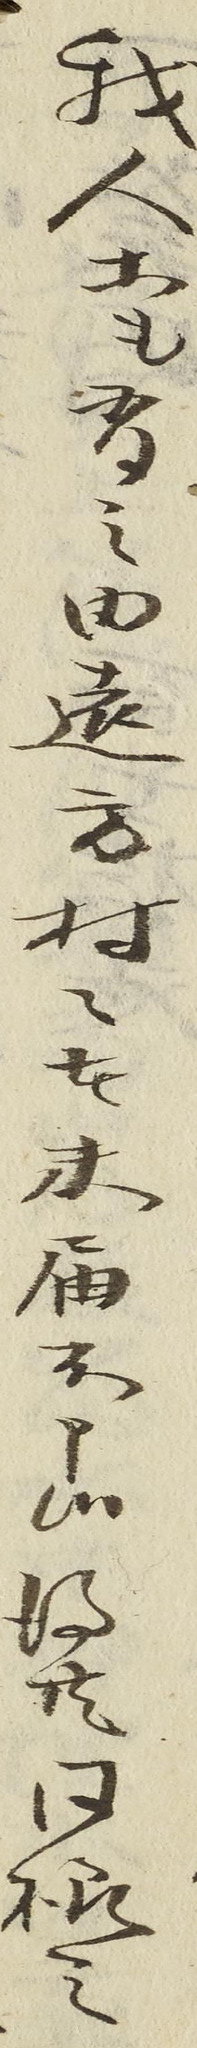我人等も有之由遠方村々は未届出不申候得共同様之
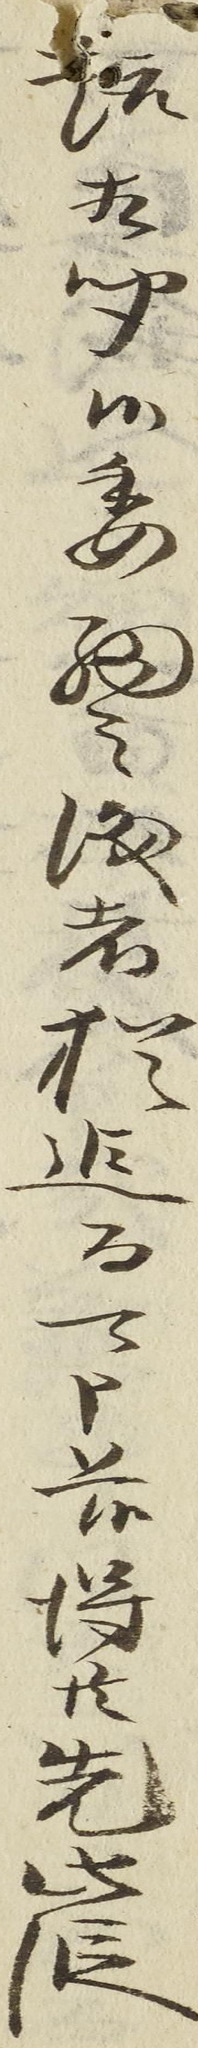趣相聞候委細之儀は猶追而可申上候得共先此段
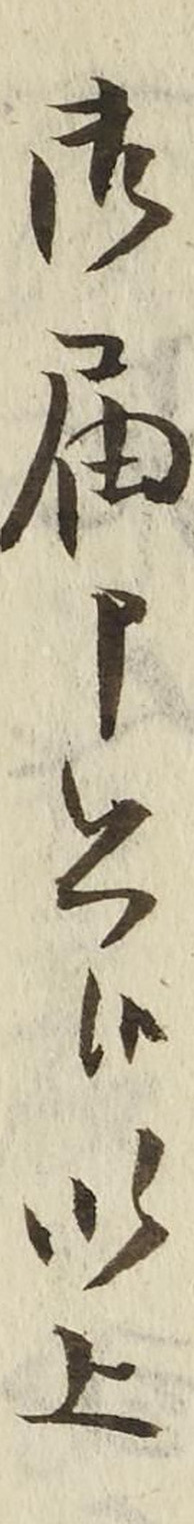御届申上候以上
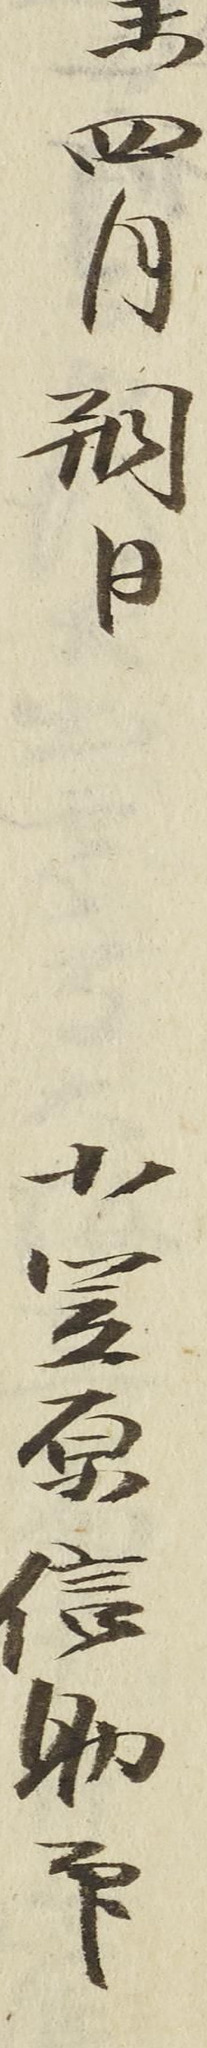未四月朔日小笠原信助
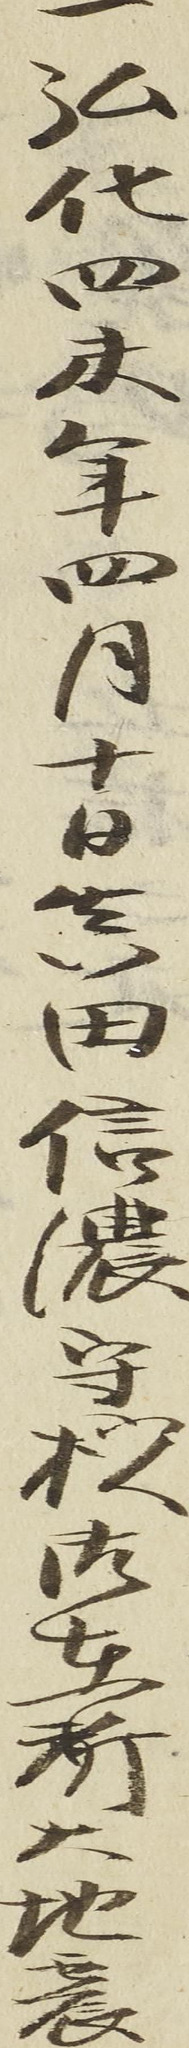一弘化四未年四月十日真田信濃守様御在所大地震
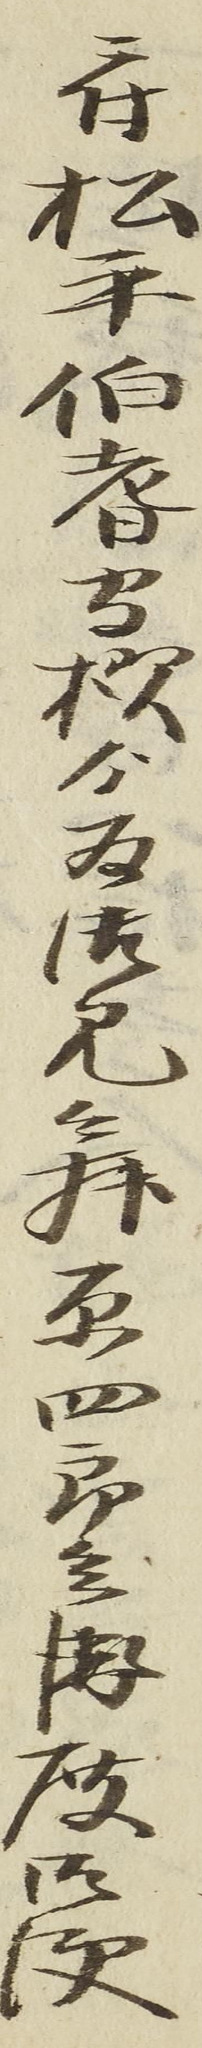二付松平伯耆守様ゟ為御見舞原四郎兵衛殿御使
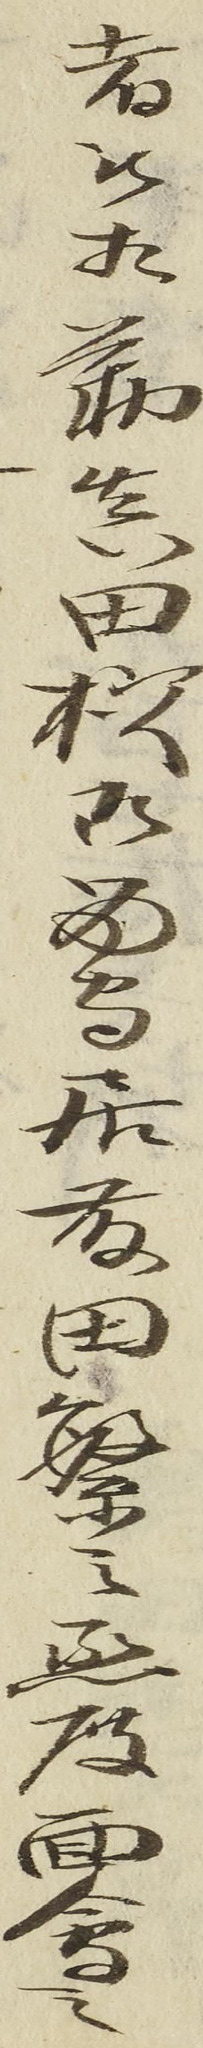者被相勤真田様為留守居藤田繁之丞殿面会之
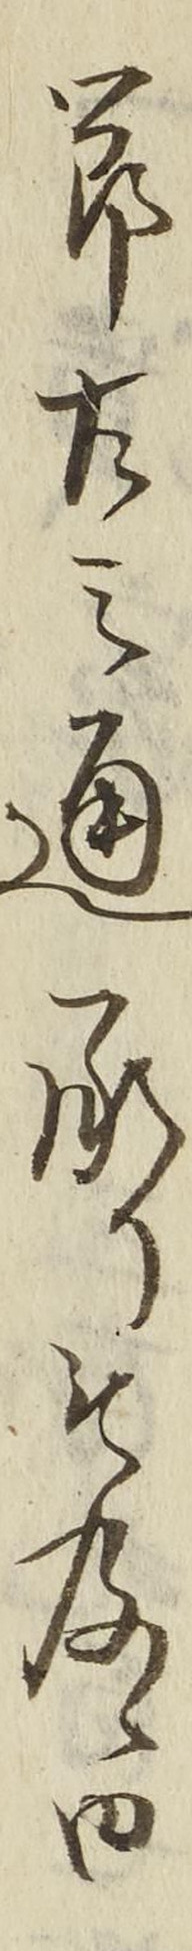節左之通承り被及候由
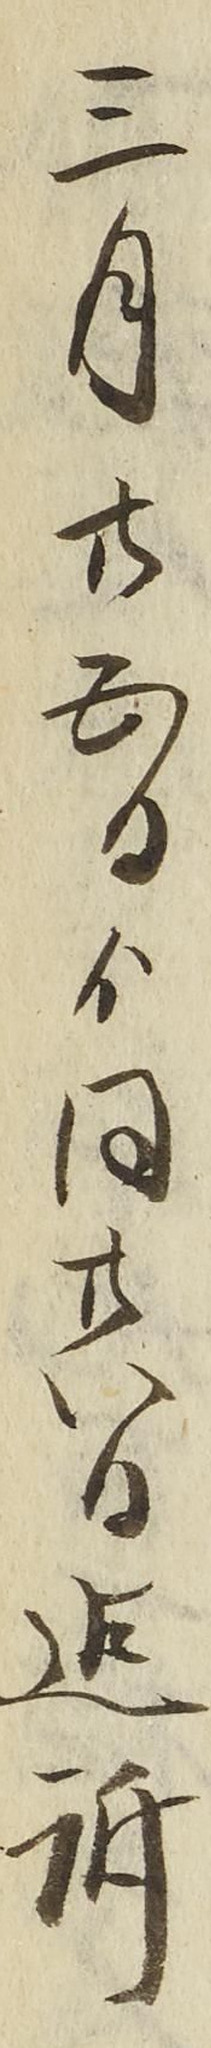三月廿五日ゟ同廿八日迄訴

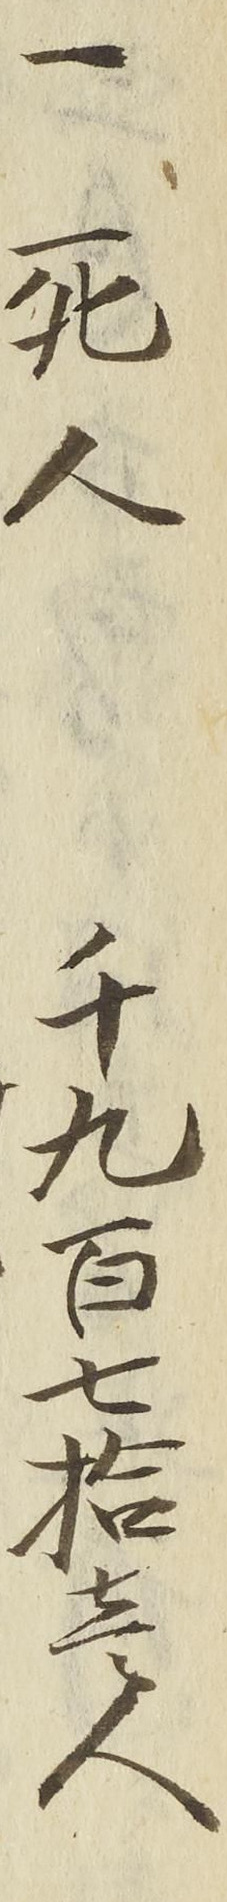一死人千九百七拾壱人
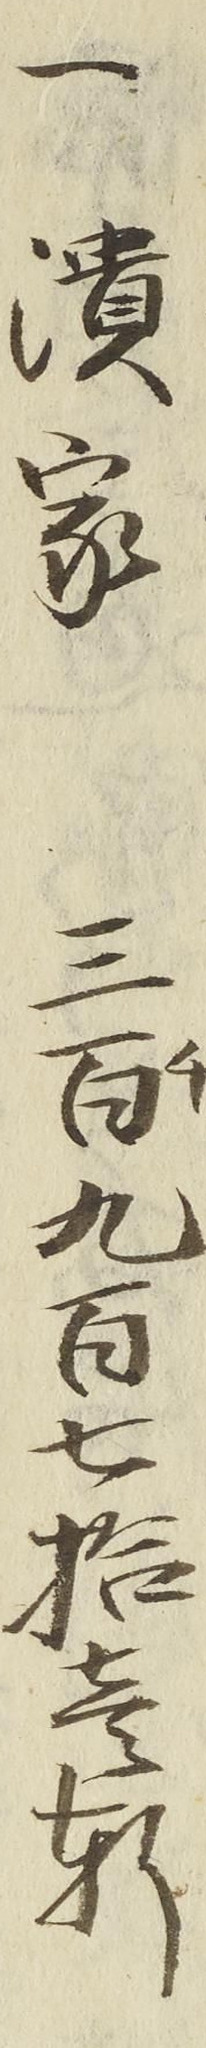一潰家三百九百七拾壱軒
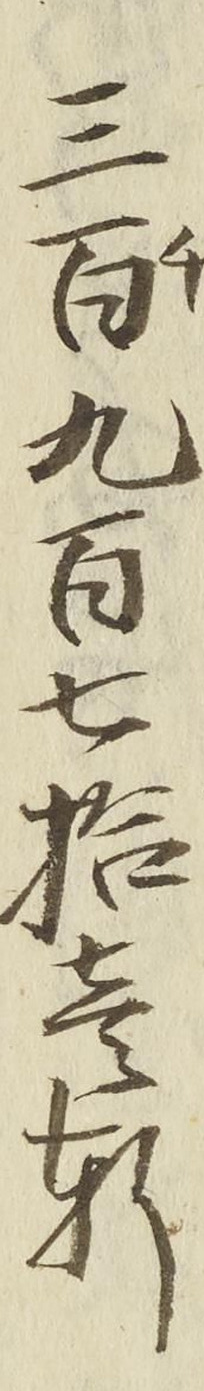一半潰九百七拾壱軒
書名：信濃國大地震記　乾
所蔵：東京大学地震研究所図書室 Earthquake Research Institute Library, The University of Tokyo, JAPAN
